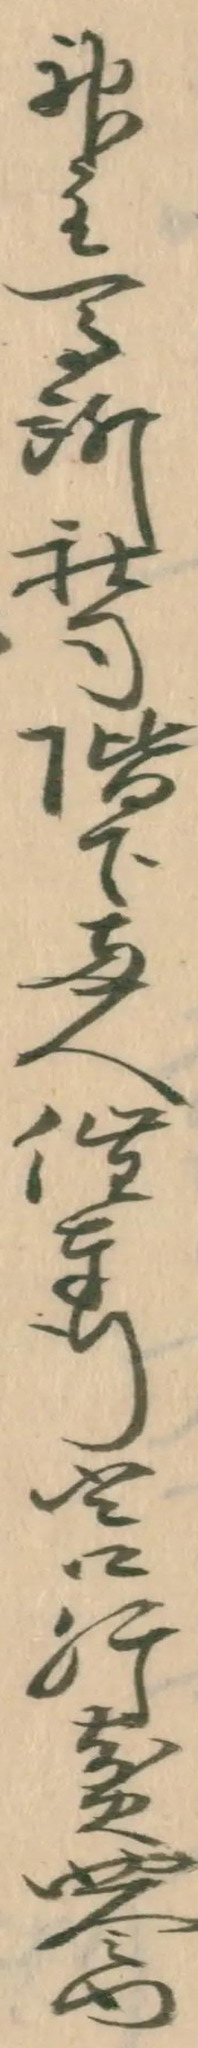神主馬所社司階下両人催奉行出口肝煎四人之内
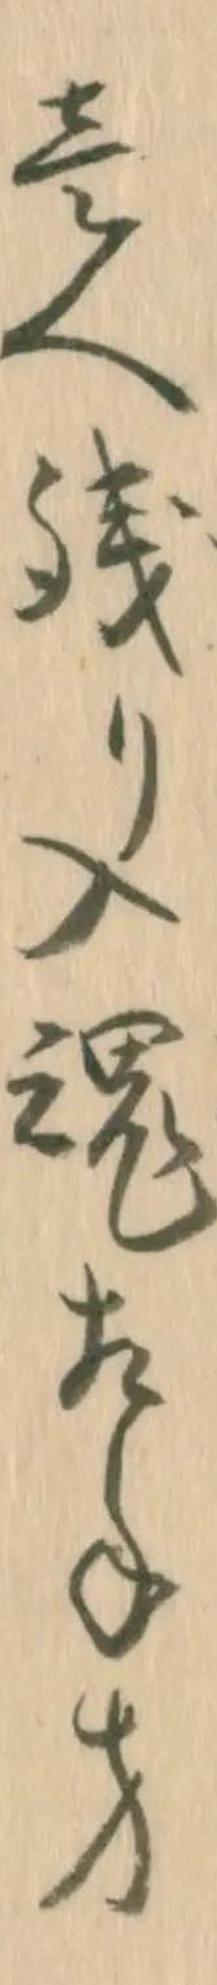壱人残り入魂相手方
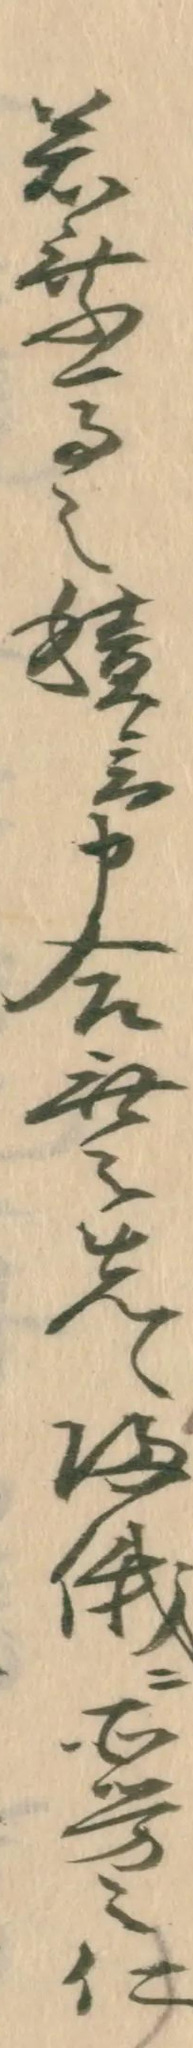一若乗馬之積ニ而申合無之先へ帰俄二所労之仁
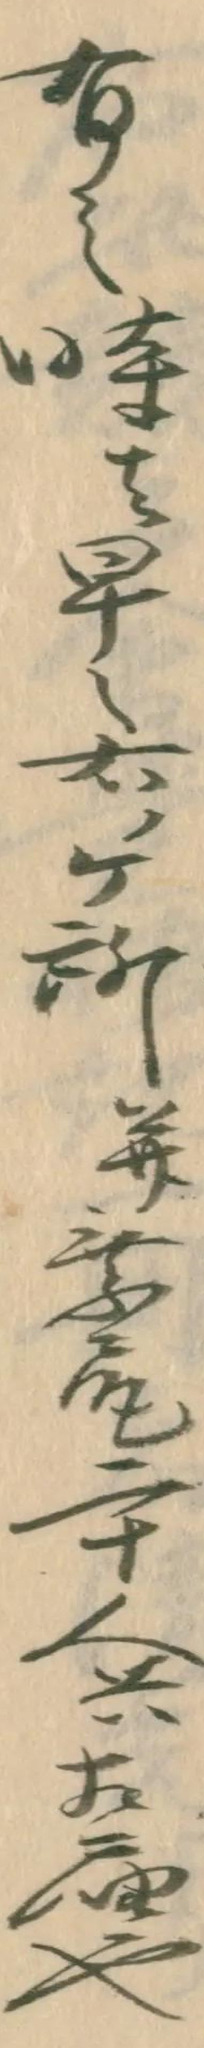有之時者早々右ノケ所并乗尻二十人共相届也
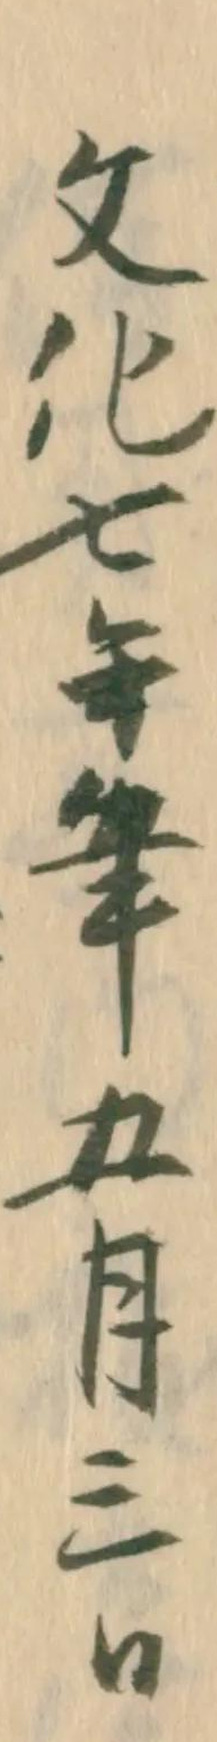一文化七午年五月三日
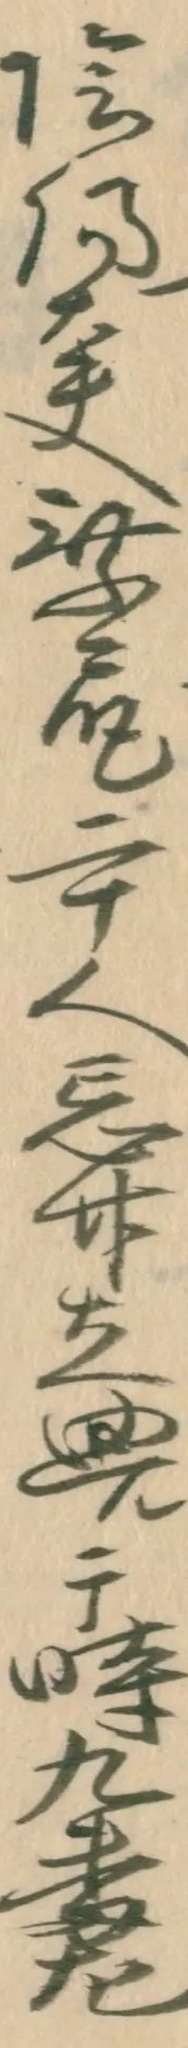陰陽大夫乗尻二十人忌済立廻ル于時九番左
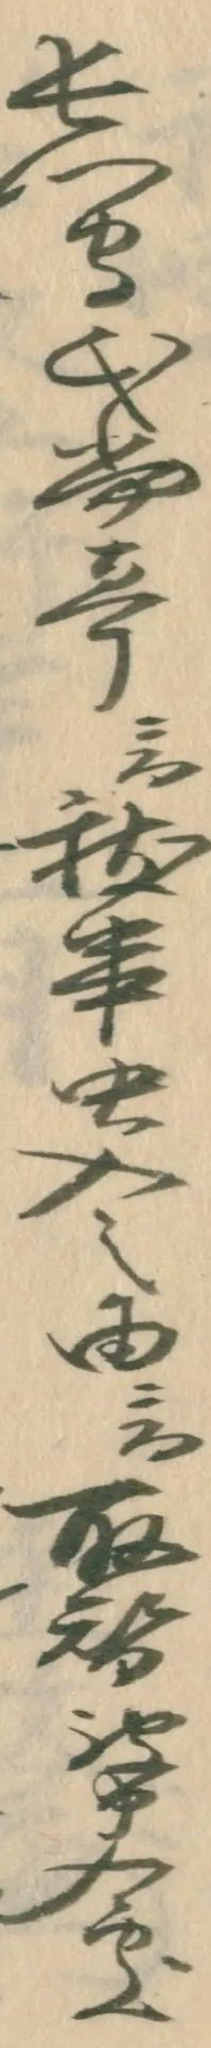長門守氏尚亭ニ而祓事虫入之由ニ而取替被申入処
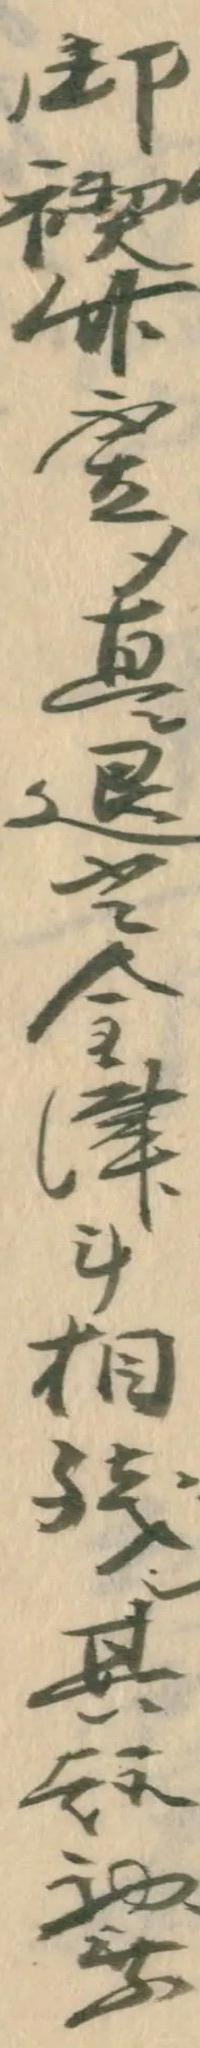御禊済不立シテ直ニ退出金津計相残シ其趣初乗
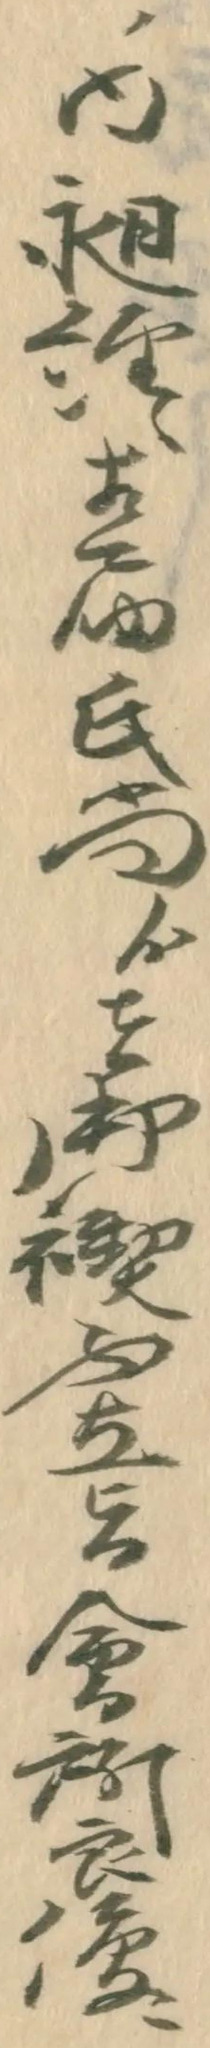ノ内昶経へ相届氏尚ゟ者御禊不立旨会所良俊へ

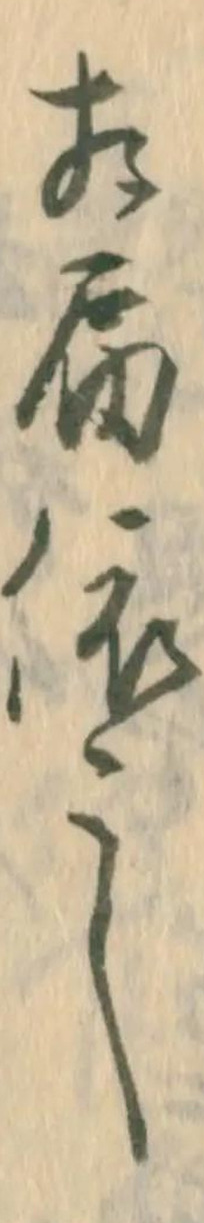相届依之
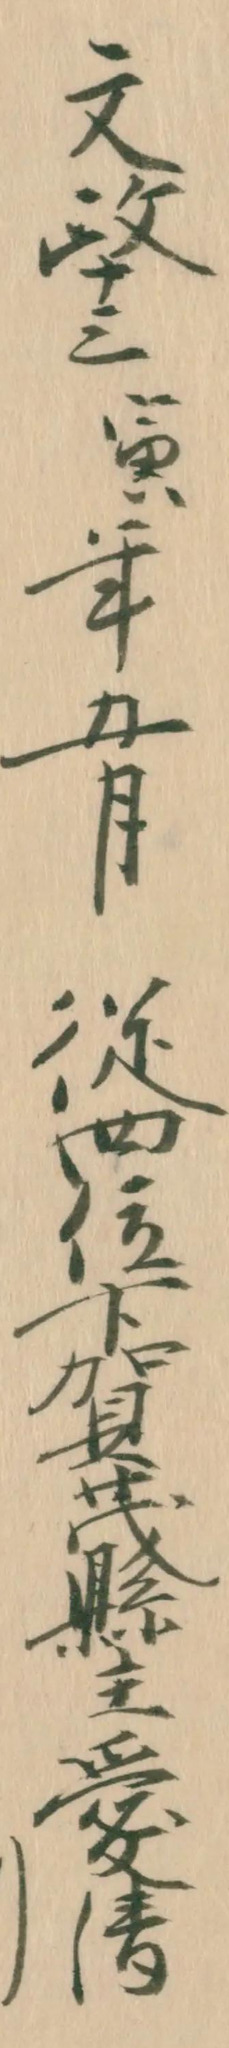文政十三寅年五月従四位下賀茂県主愛清判
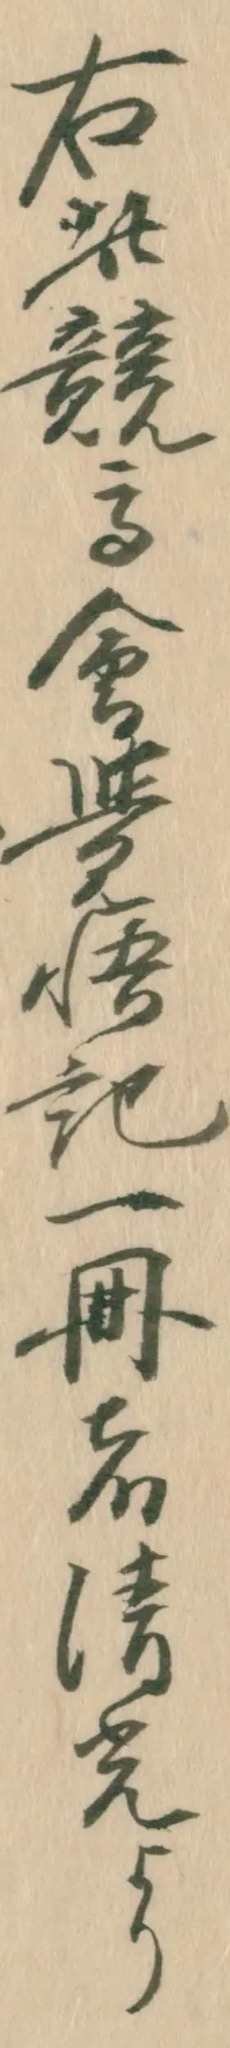右此競馬会覚悟記一冊者清光より
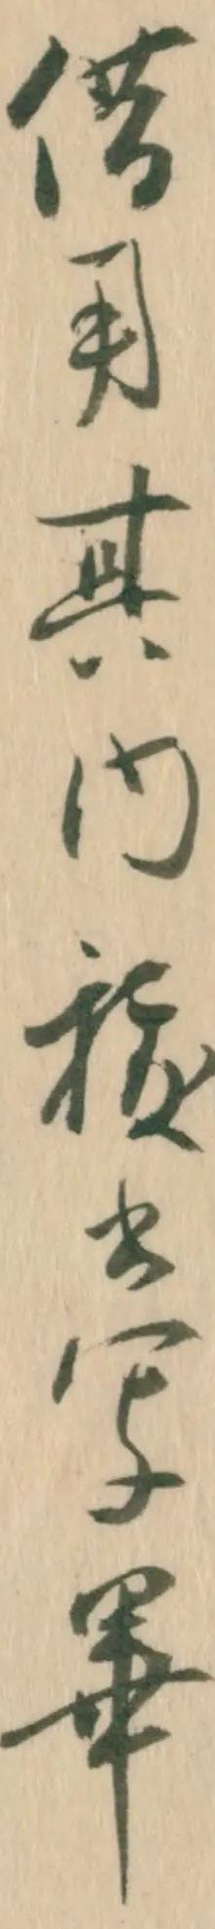借用其内抜書写畢
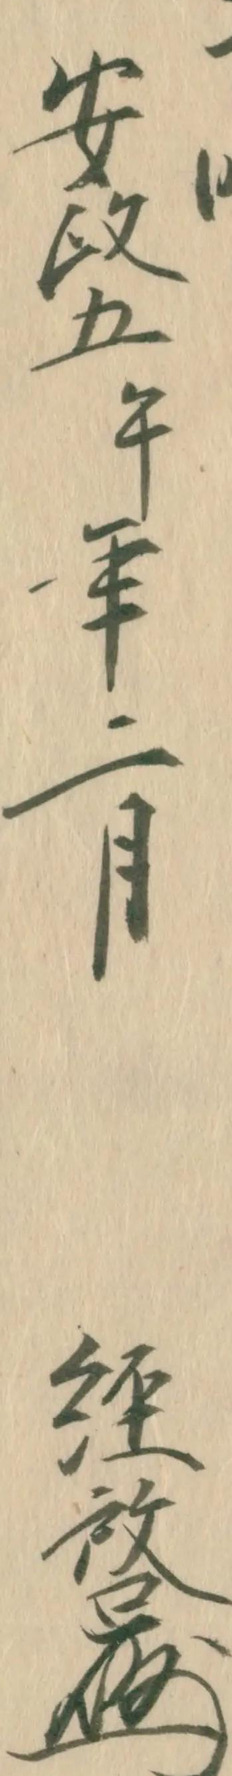安政五午年二月経啓

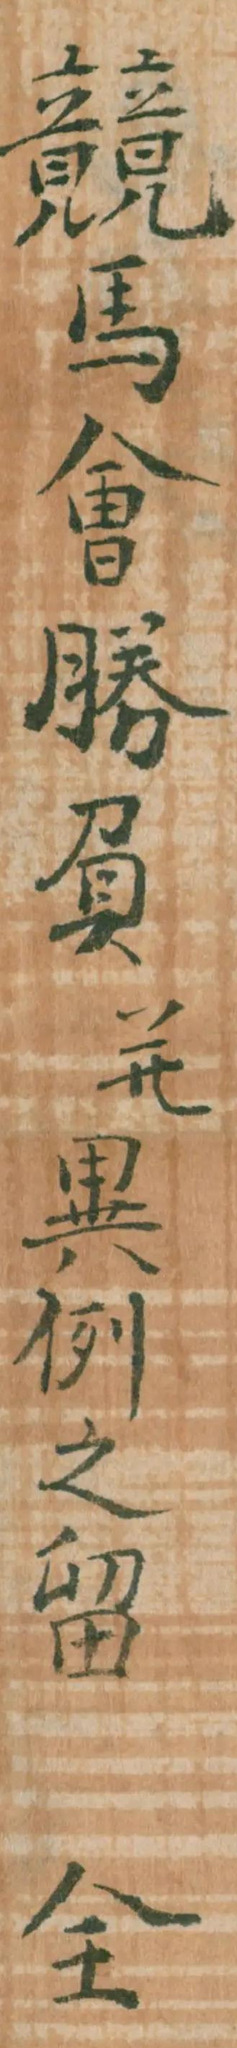競馬会勝負并異例之留全

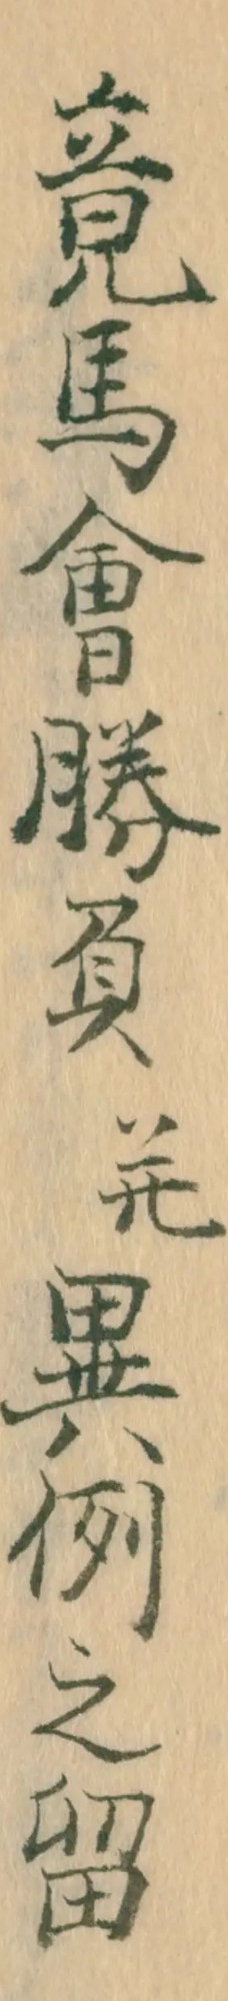競馬会勝負并異例之留全
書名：賀茂社記録. 第12冊
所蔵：国立国会図書館 National Diet Library, JAPAN
